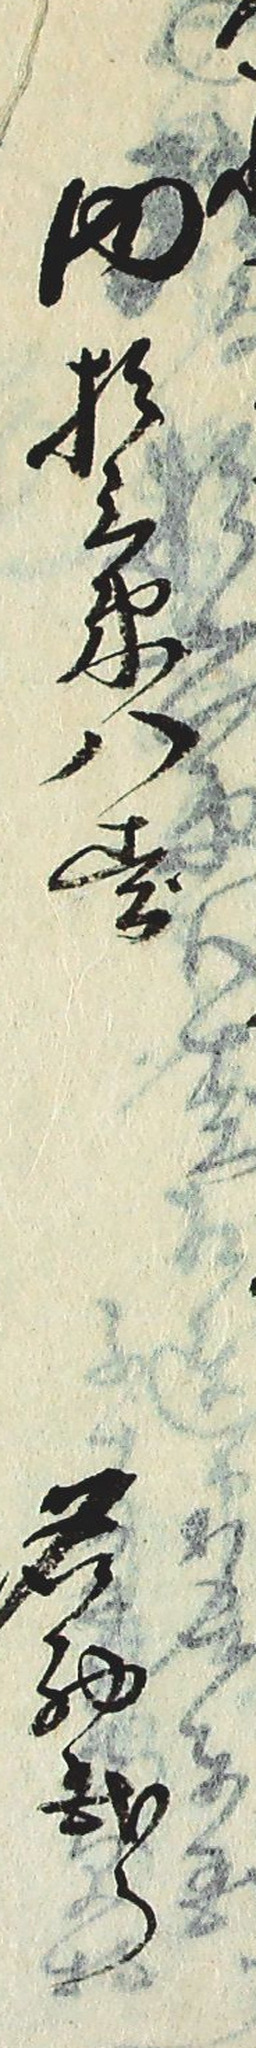内拾三束八歩名西当り
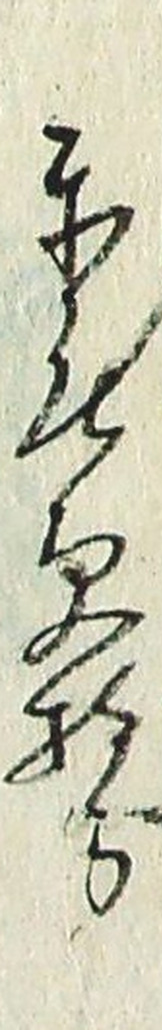楽屋受持分

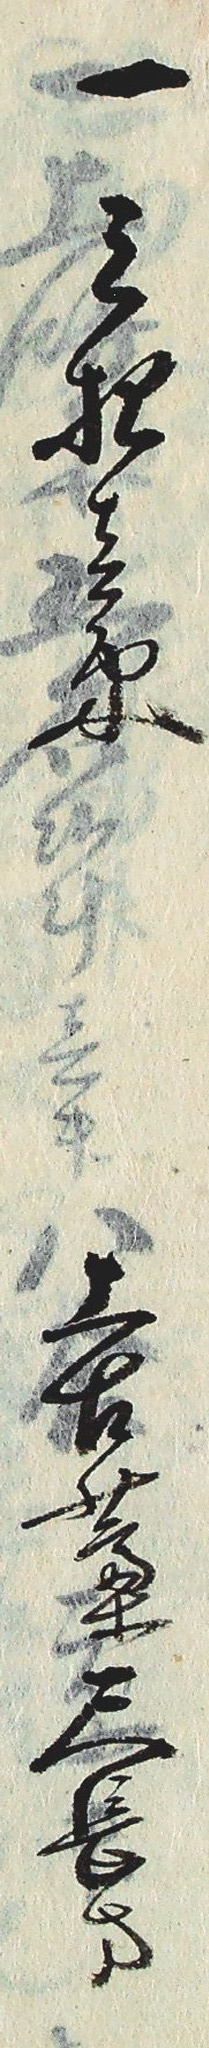一三拾壱束上古藁尺長方
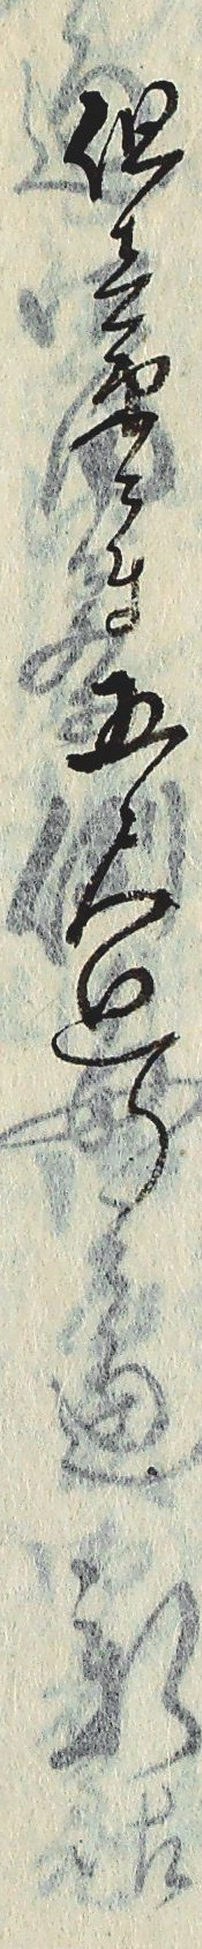但壱束に付五尺廻り
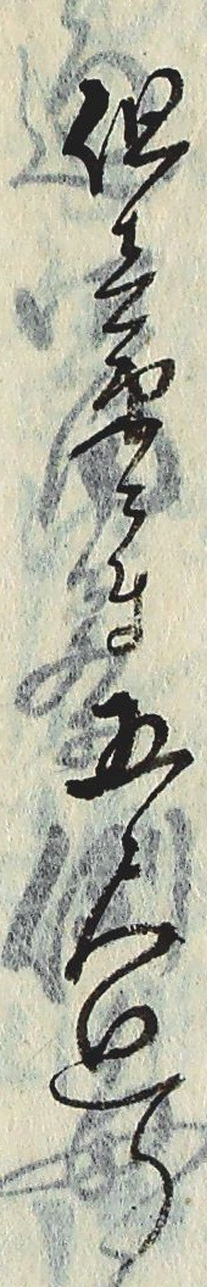但壱束に付五尺廻り
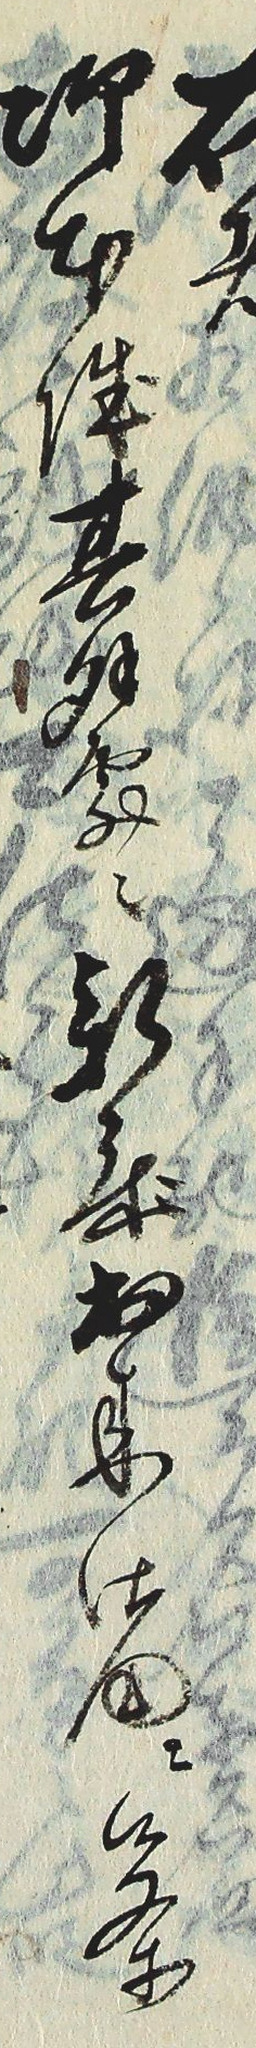御本城其外処々新床出来仕成に候条
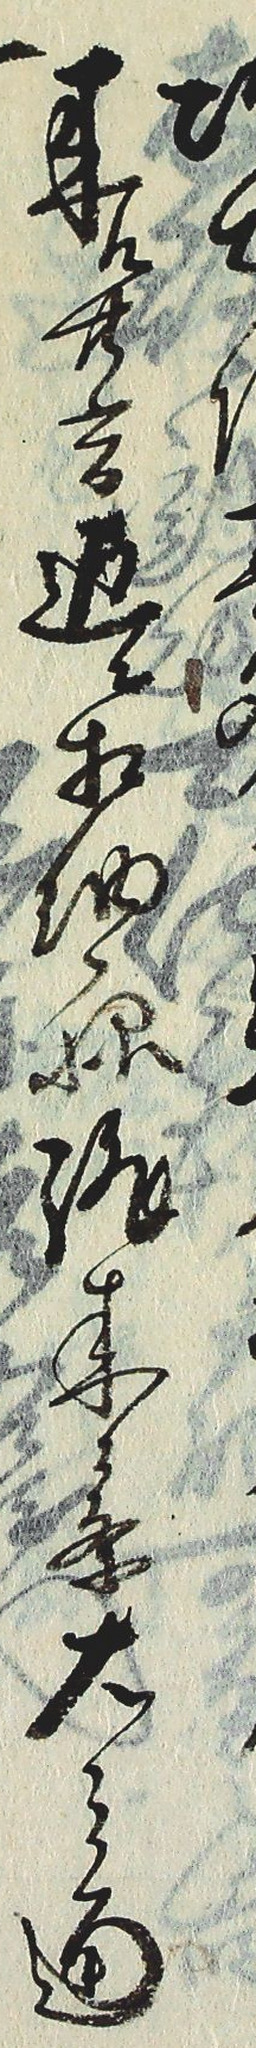来る廿六日迄に相納候様誂来候条右之通
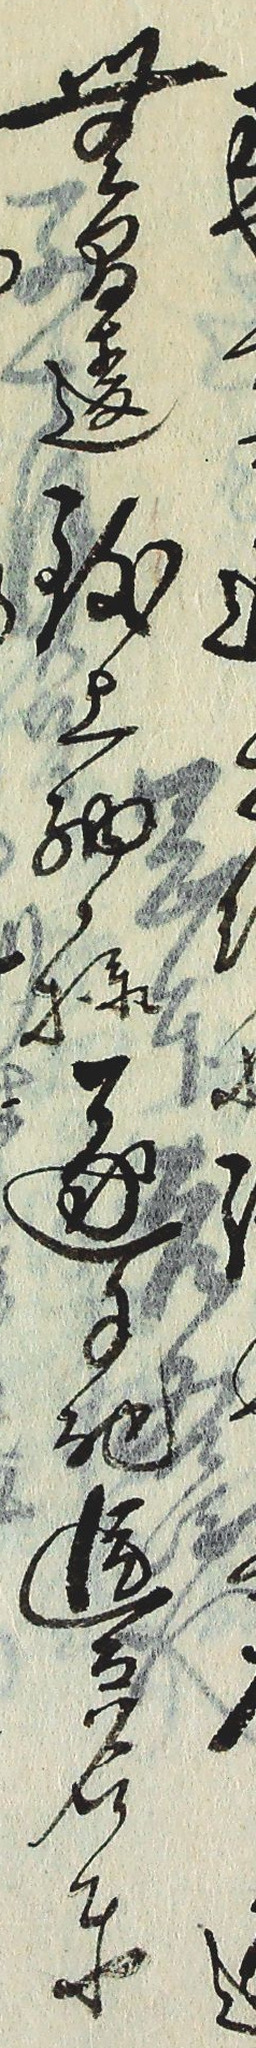無間違致上納候様遂手配追て名東
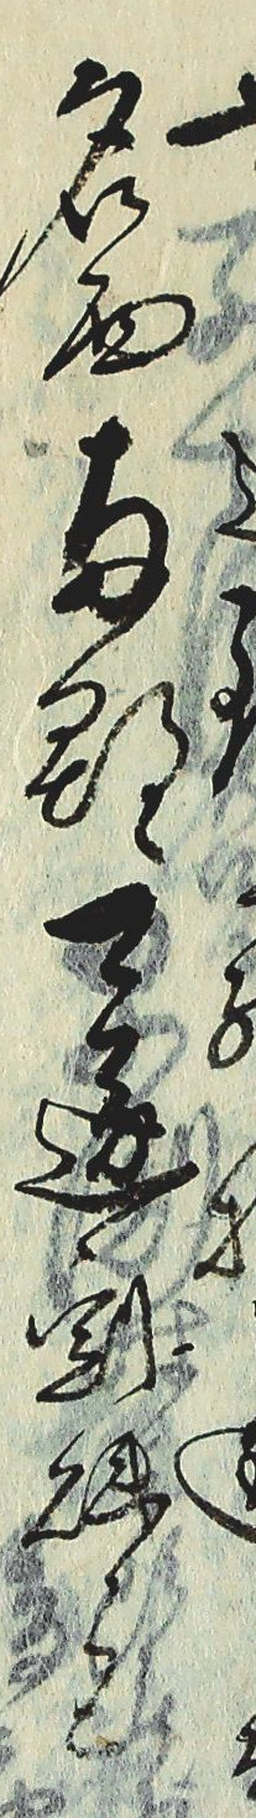名西両郡へ可遂割賦候以上
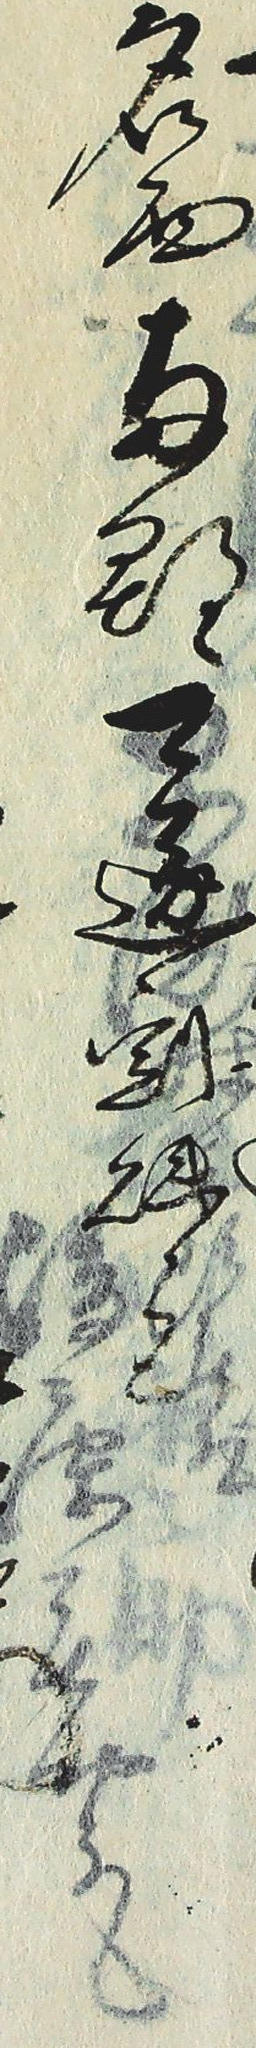名西両郡へ可遂割賦候以上
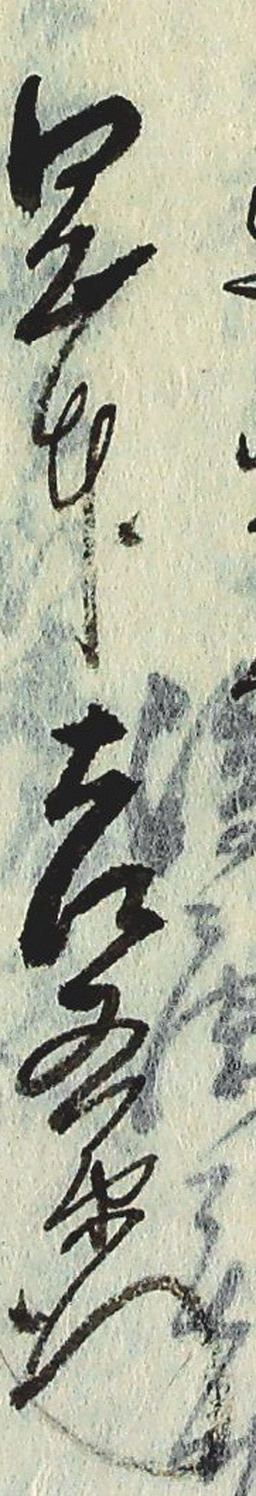岡本吉右衛門
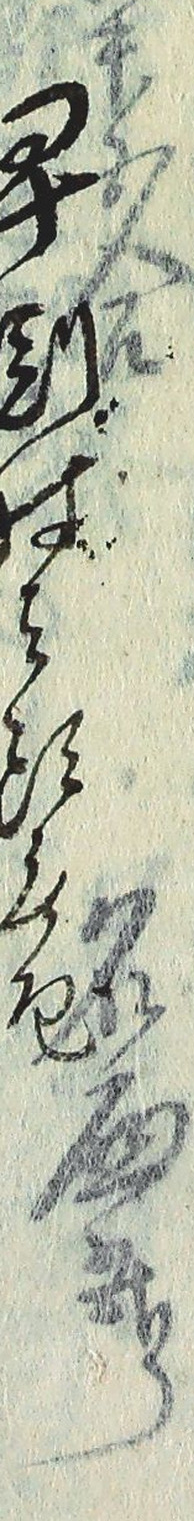早淵村与頭庄屋
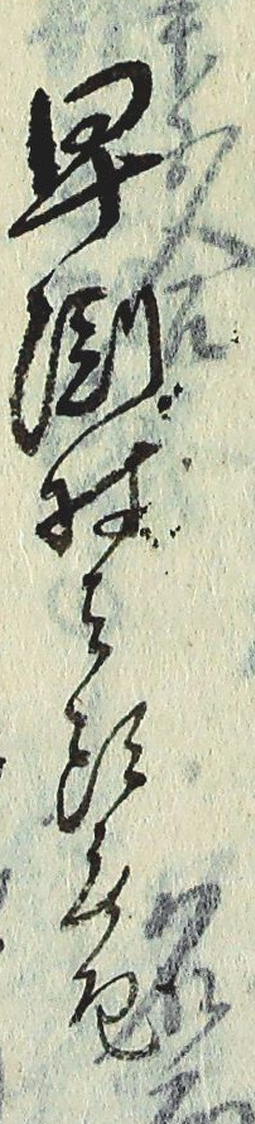早淵村与頭庄屋
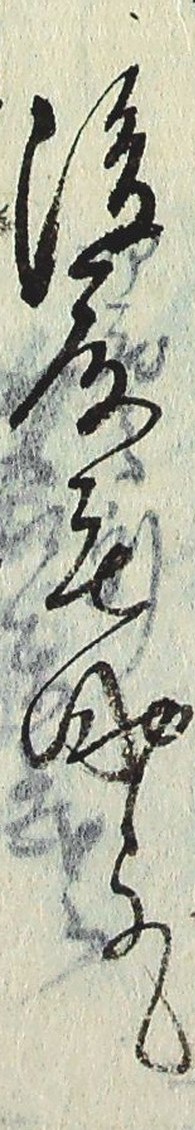後藤庄助方へ
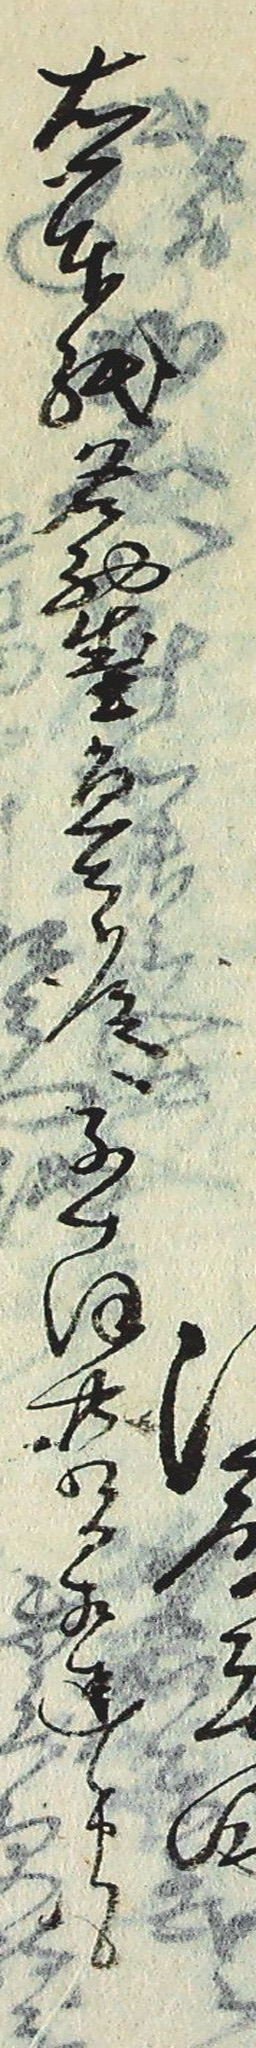右御本紙名西盛宣七郎殿へ子十月廿九日相達し申候以上
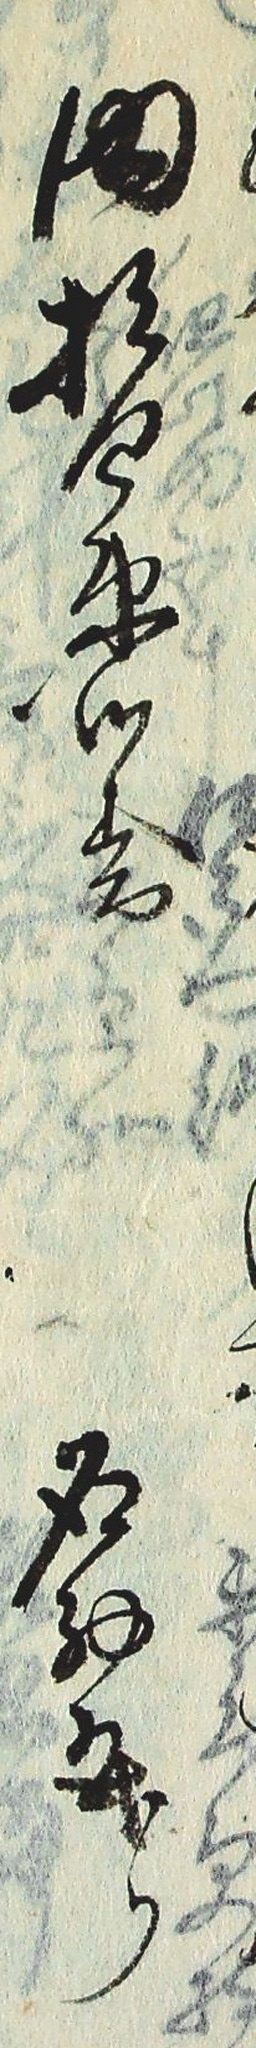内拾四束弐歩名西当り
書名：名東郡中諸割賦元帳
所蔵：鳴門教育大学 Naruto University of Education
